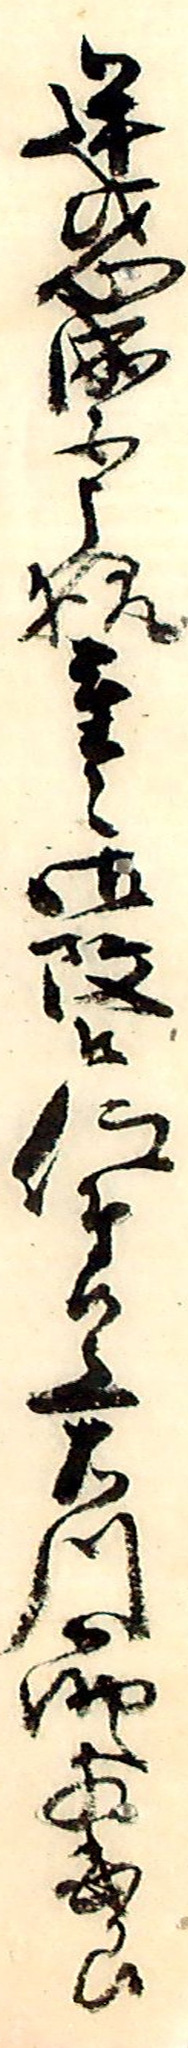迷惑成不申様重々御改被仰付候上右川筋へ相当り候
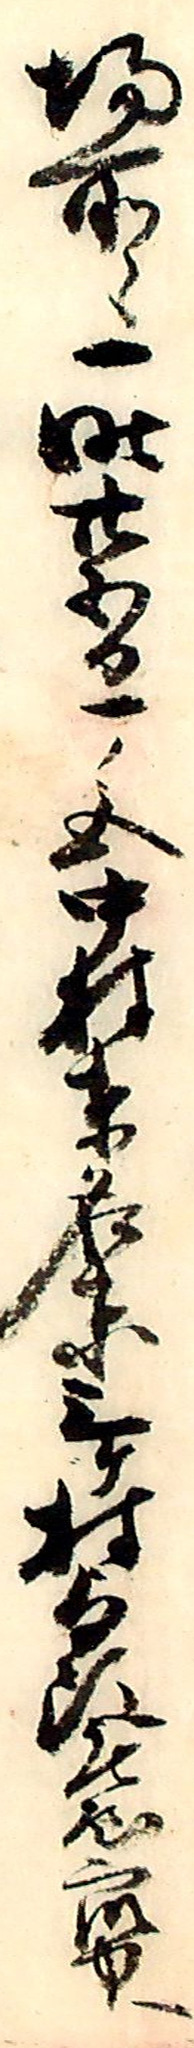場所に一昨廿五日一ノ宮中村東名東三ヶ村与頭庄屋衆中へ
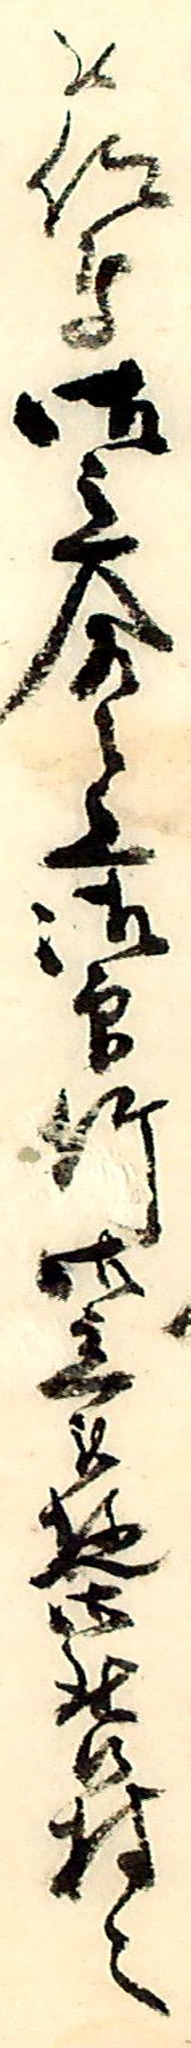被仰付御立合之上御印竹御立被遊御座候村々
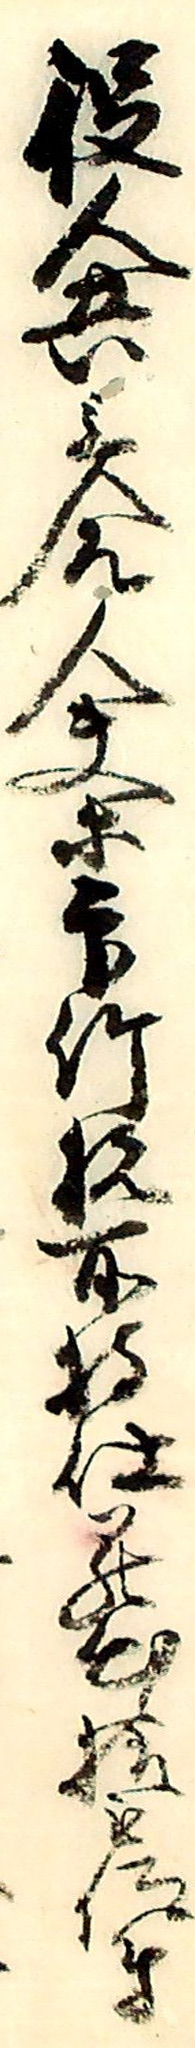役人共立合人夫等印竹杭所持仕罷出候様被仰付
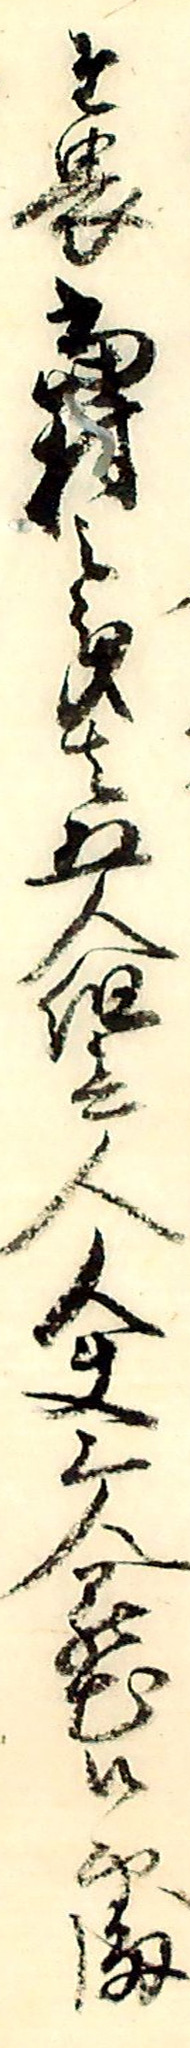奉畏当村之義は五人組壱人人夫三人罷出候処
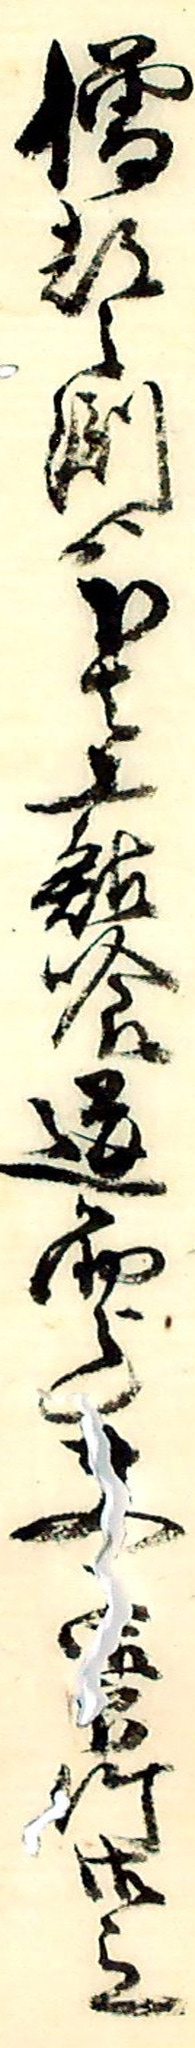僧都之淵ゟ下は上鮎喰道筋迄夫々御印竹御立
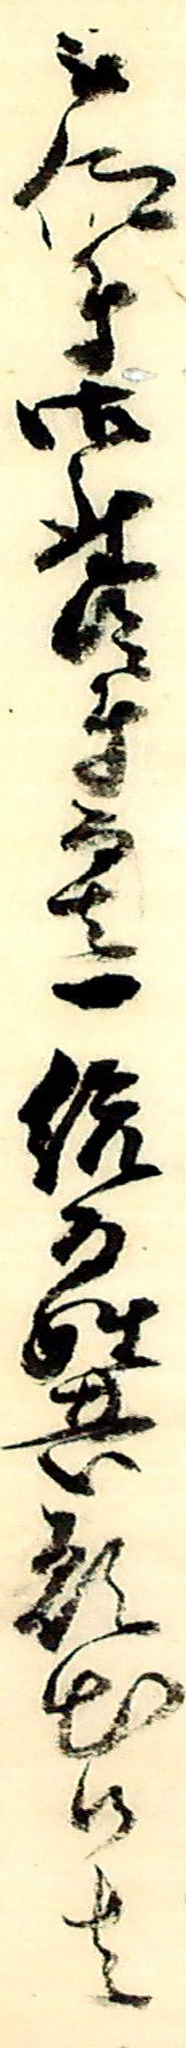被仰付御座候に付ては一統百姓共願出候は
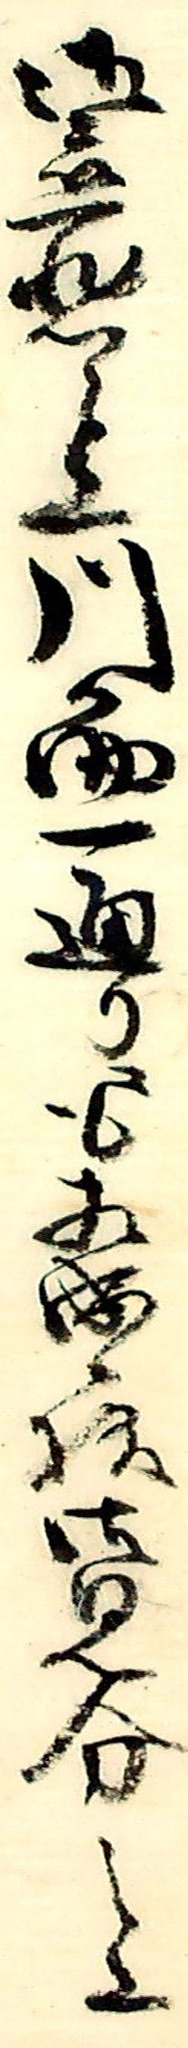御慈悲之上川筋一通りにも相成候様御見分之上
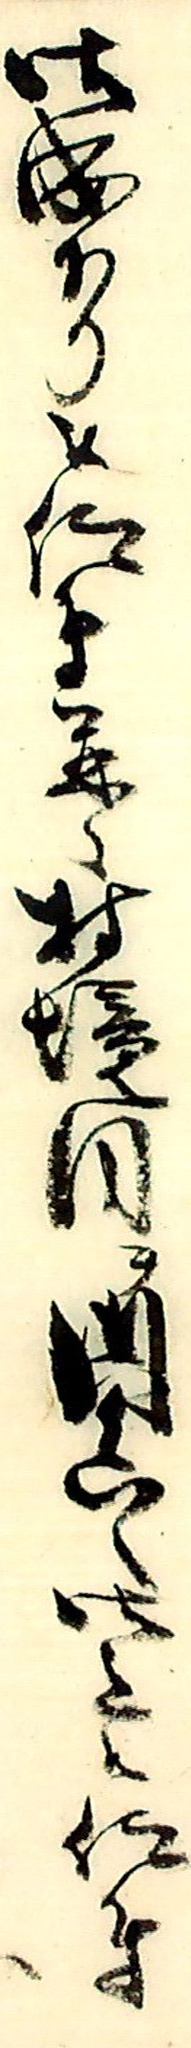御成下り被仰付并に村境目を川真へ御立被仰付
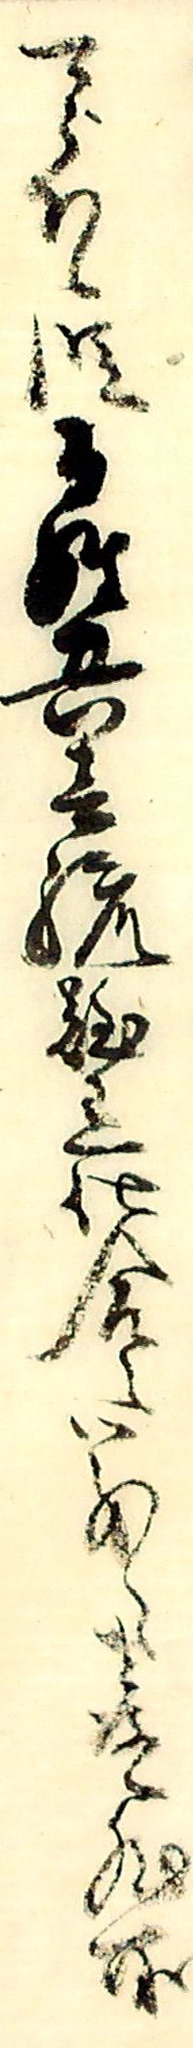可被下候段百姓共壱統難有仕合之御義に奉存候然所
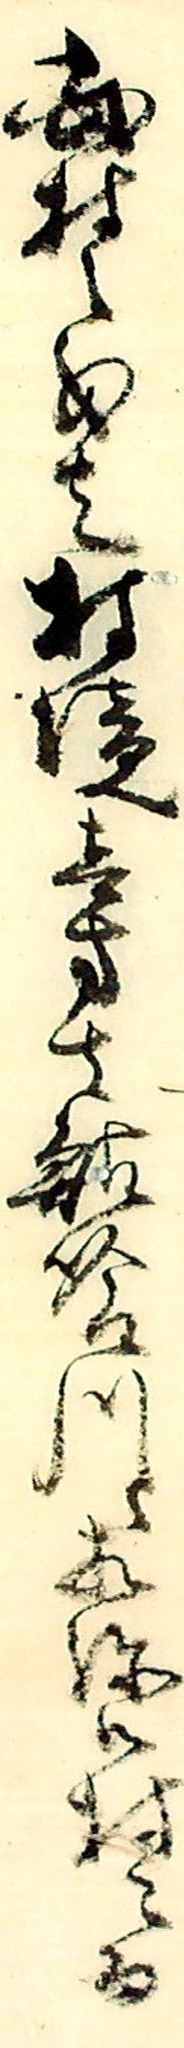当村之義は村境壱方は鮎喰川に相添候村にて
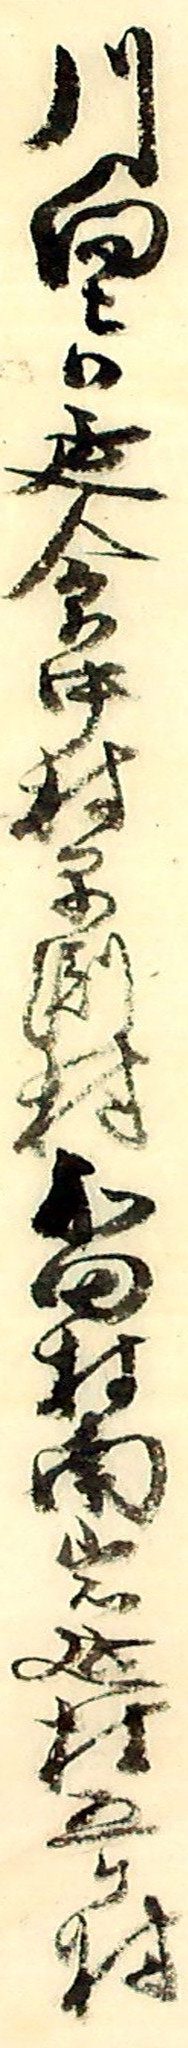川向ヒは延命中村早淵村和田村南岩延村五ヶ村
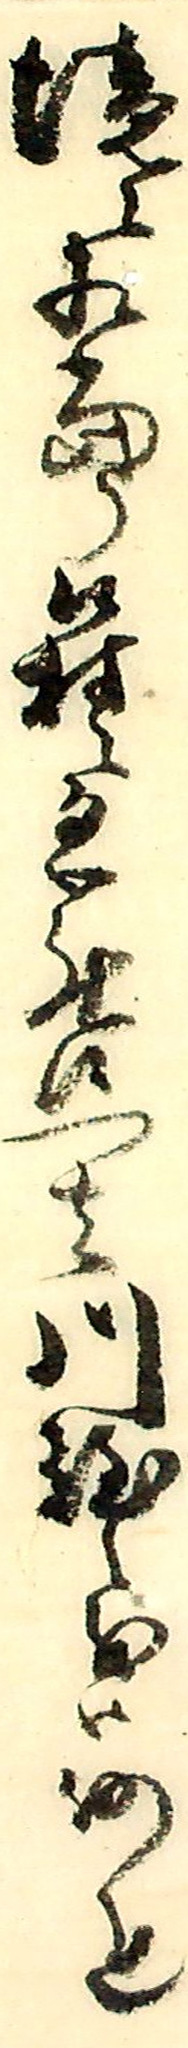境に相当り候村にて御座候へは川難之義は何れ
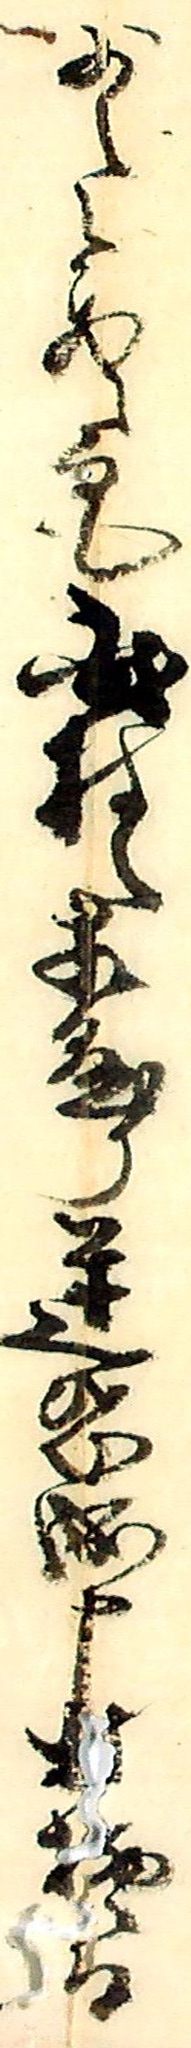少し之義にても当村へ相懸り迷惑成申村柄にて
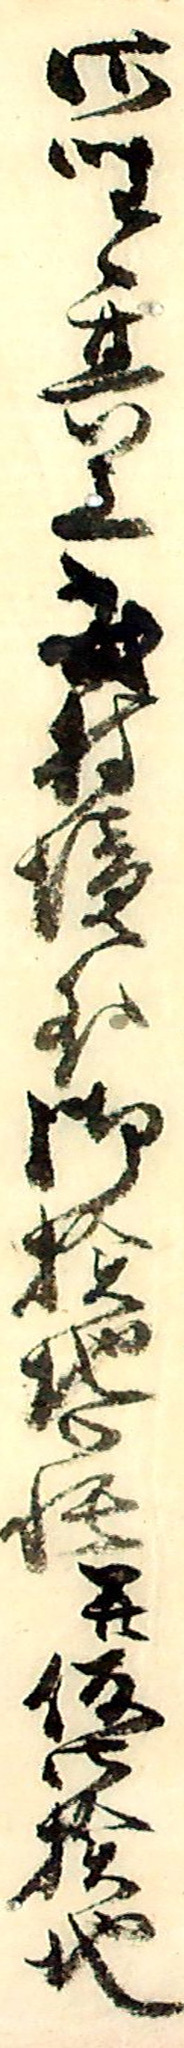御座候其上当村境外御検地御帳并仮御検地
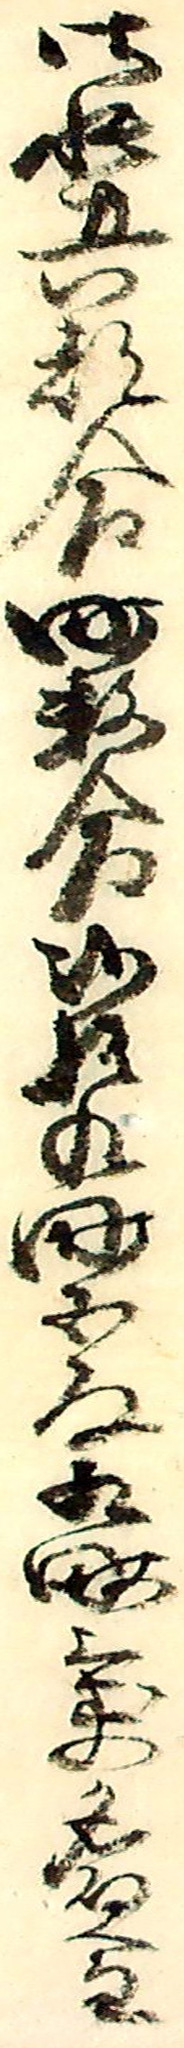御帳共都合町数合弐拾九町五反九畝三歩名負主
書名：諸御願書控(後藤氏壱番）
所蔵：鳴門教育大学 Naruto University of Education
